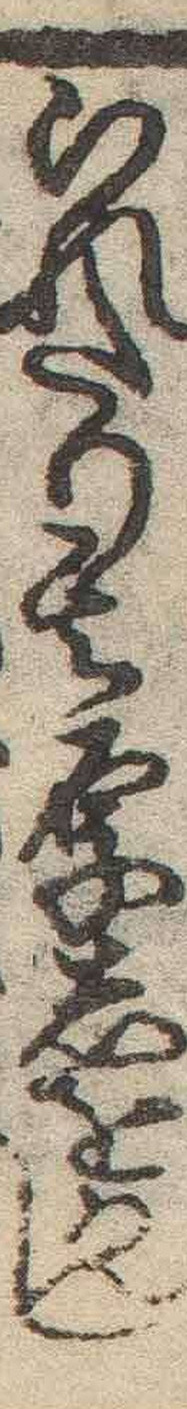られたり其厚志をかんし
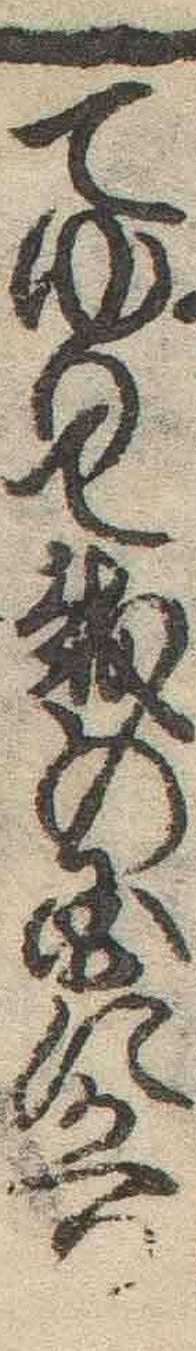てゆつて越の国にかへり
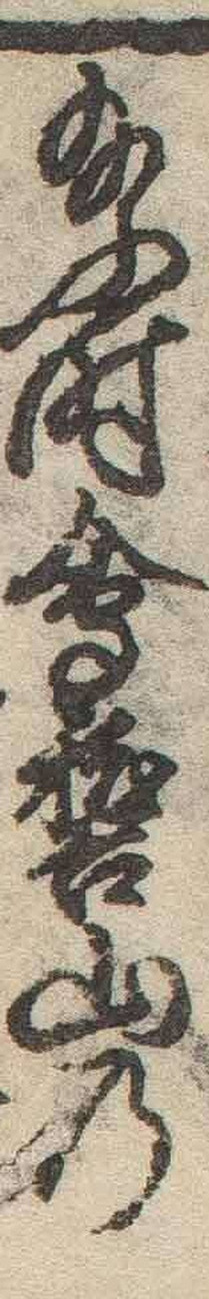給ふ時會稽山の
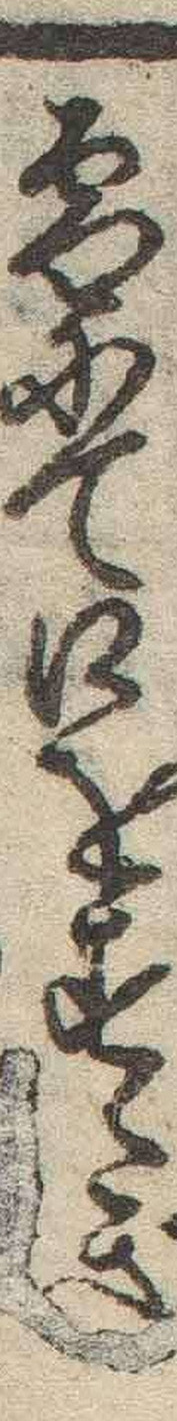雪にて口をすゝぎ
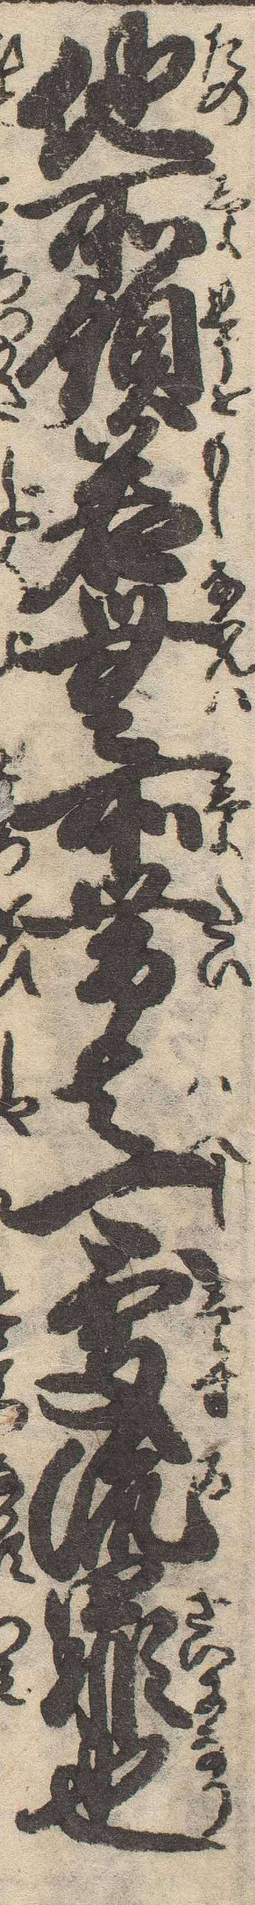他所領若無所帯者可處流罪也
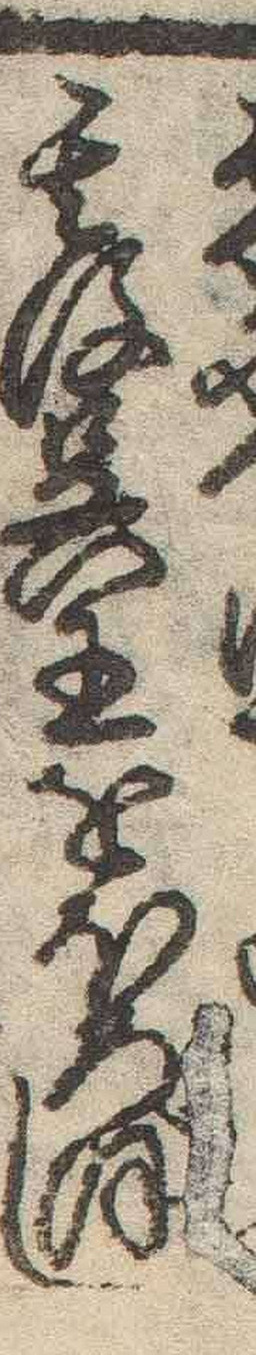其後呉王をほろぼし
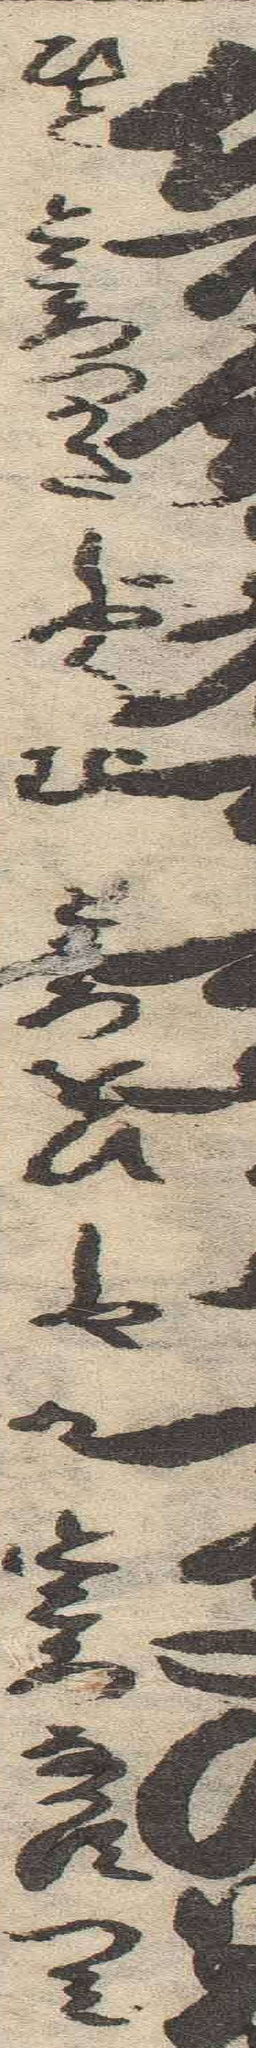ひとところつかさじやくむところをひしやかところなかすつみ
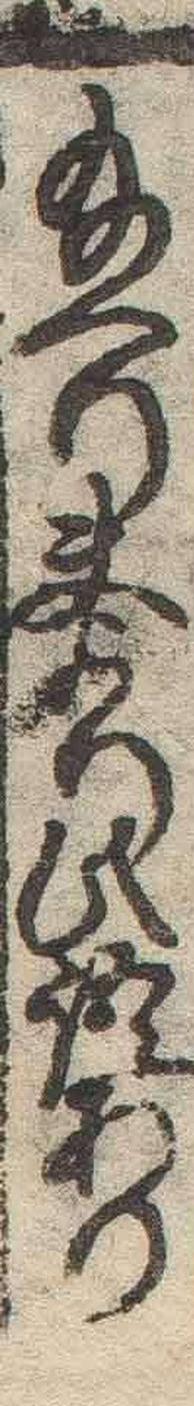給へり夫より此の語あり
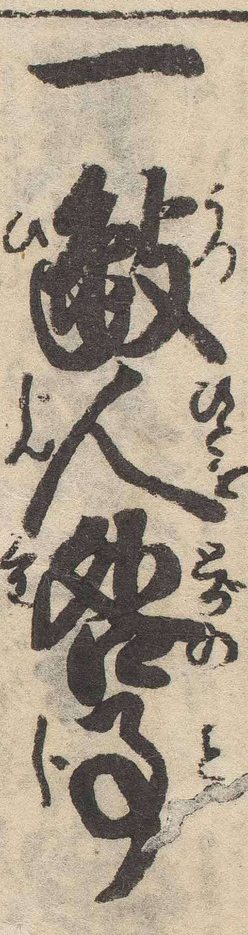一殴人咎事
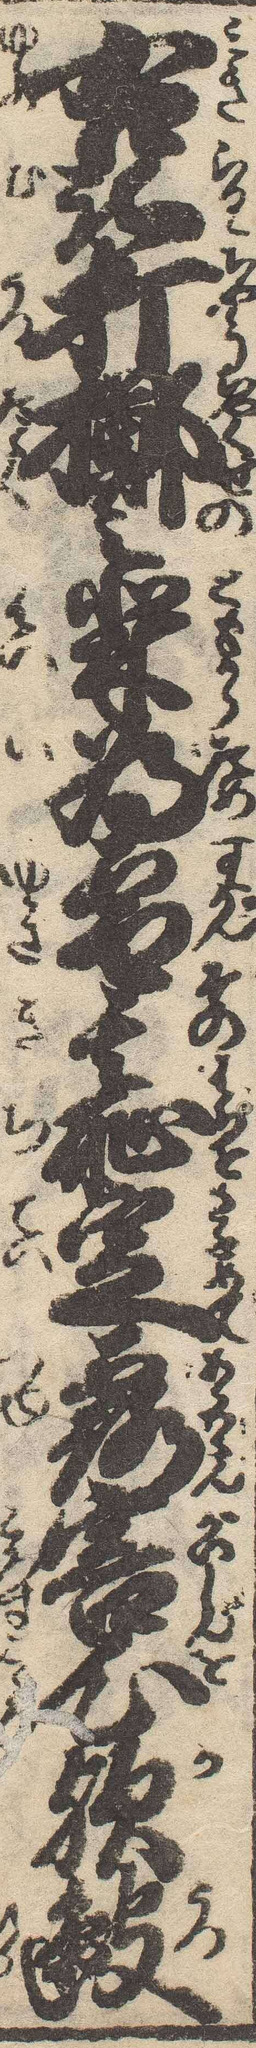右被打擲之輩為雪其恥定露害心欤殴
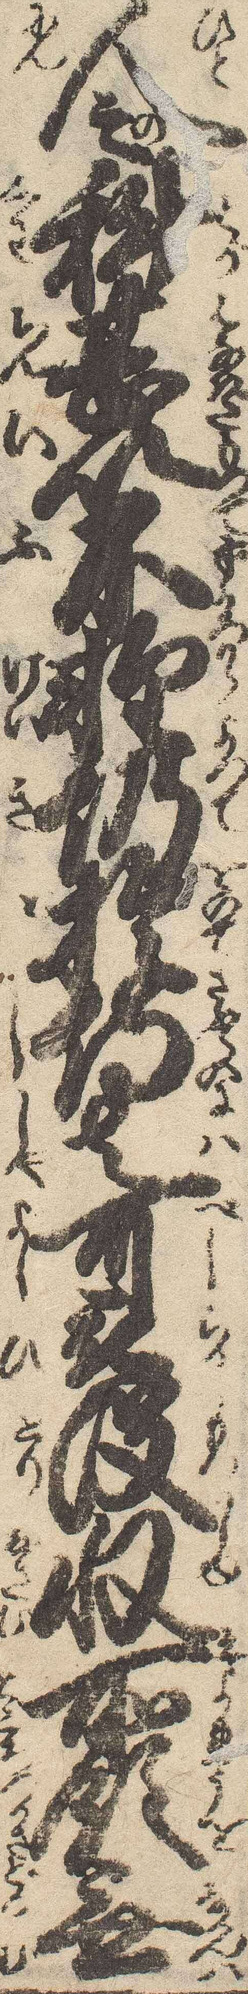人之科甚以不輕仍於侍者可被没収所領無
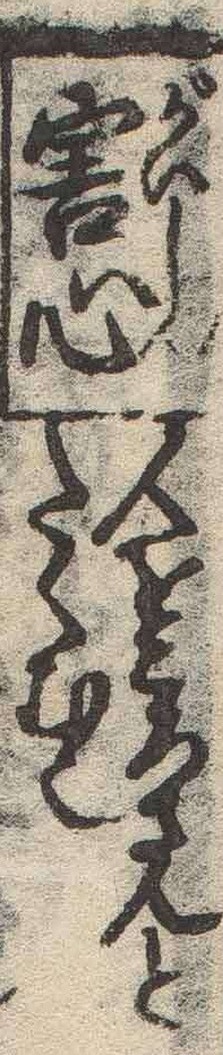害心人をころさんと
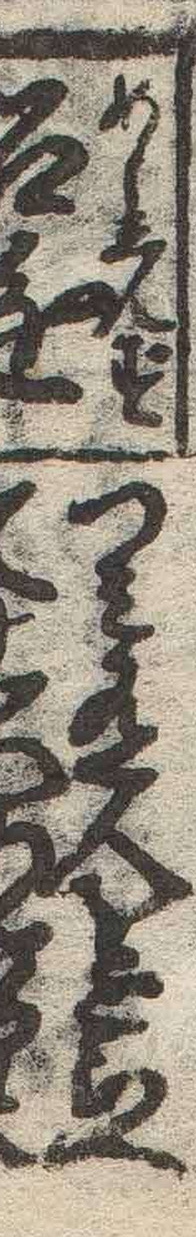召進つみ有人をとらへ
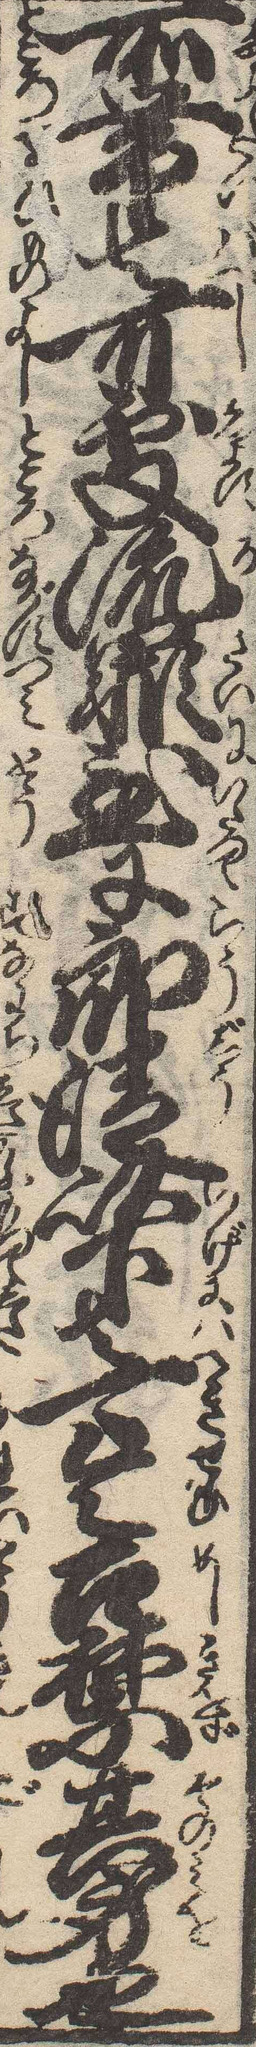所帯者可處流罪至又郎従以下者可令召禁其身也
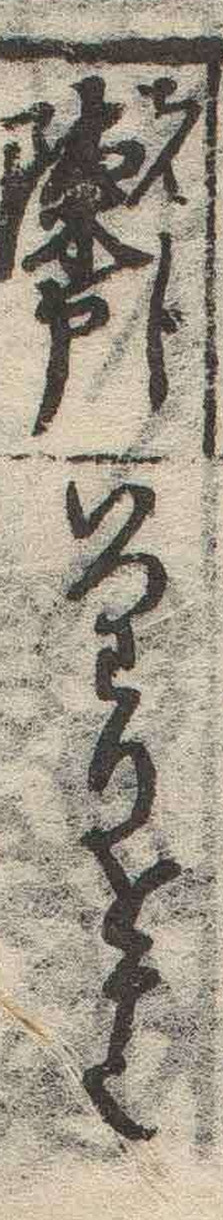陳申いつわりを申也
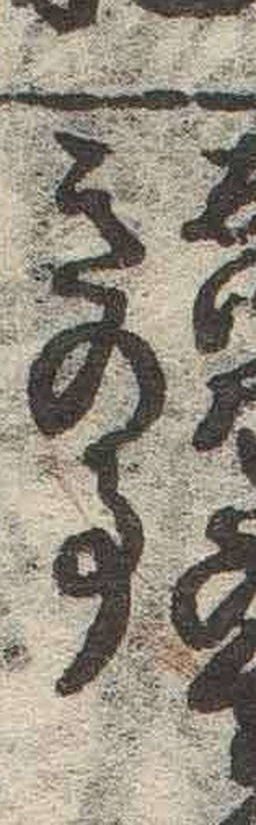きの事
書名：御成敗式目絵抄
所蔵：東京学芸大学附属図書館 国文学研究資料館
